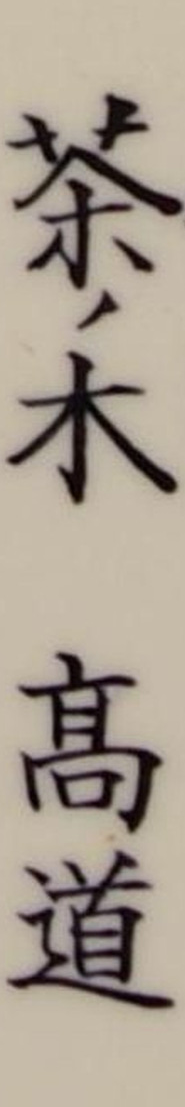茶ノ木高道
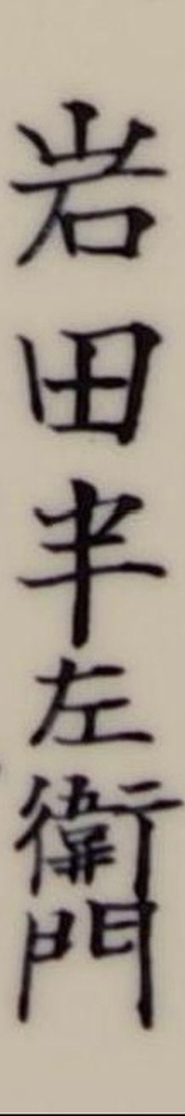岩田半左衛門
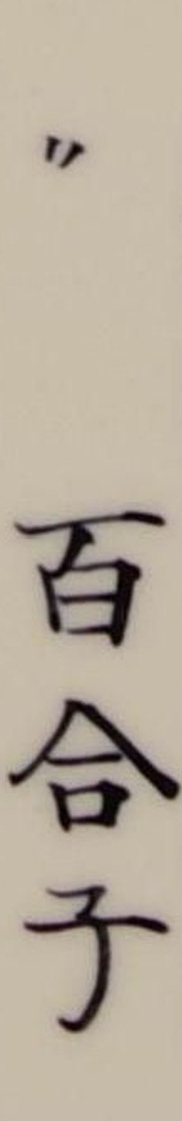百合子
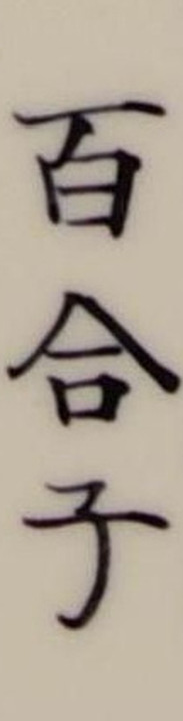百合子
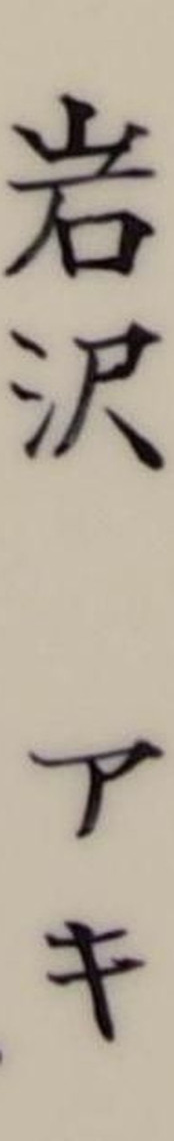岩沢アキ
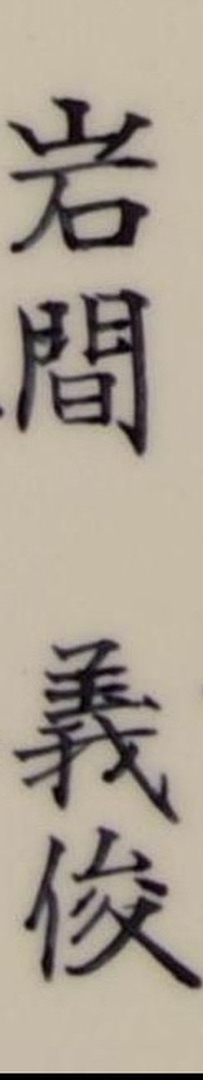岩間義俊
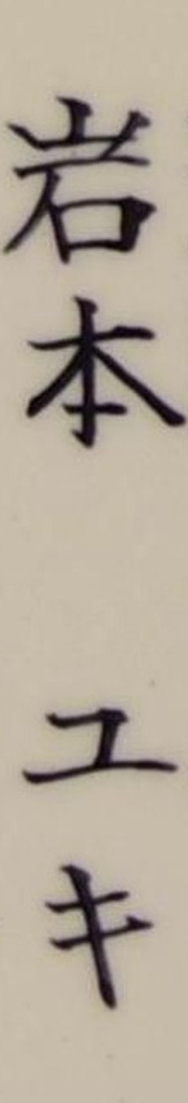岩本ユキ
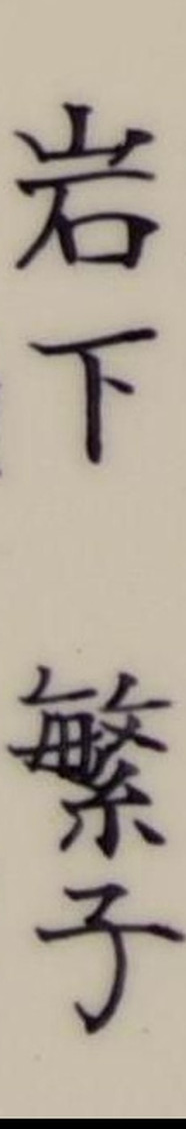岩下繁子
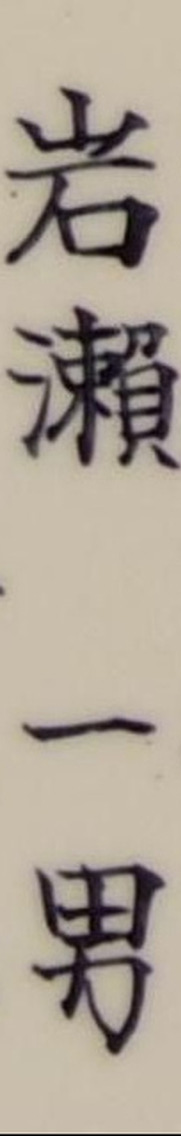岩瀬一男
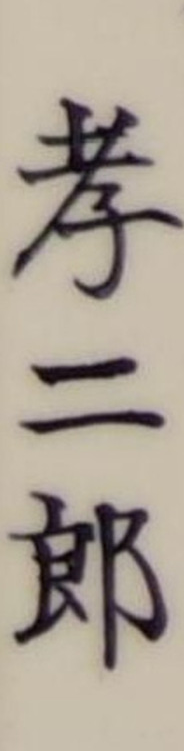孝二郎

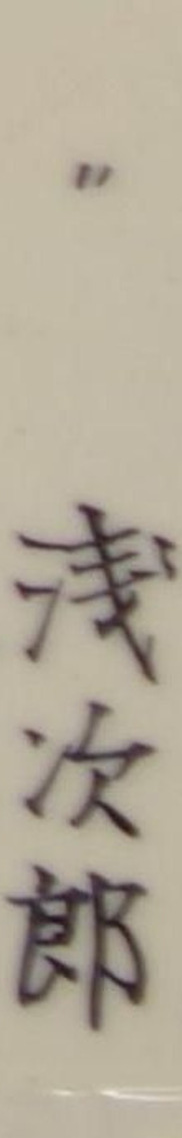浅次郎
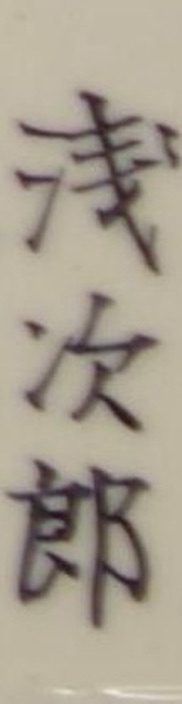浅次郎
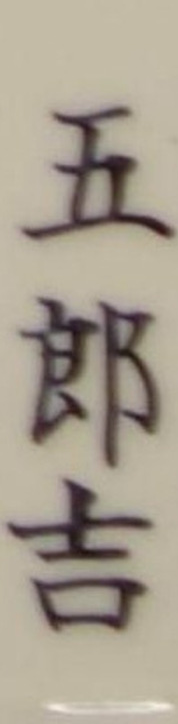五郎吉
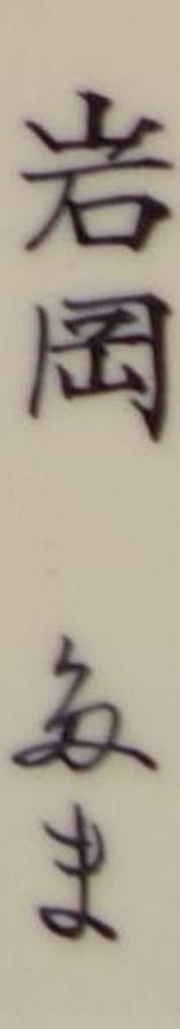岩岡たま
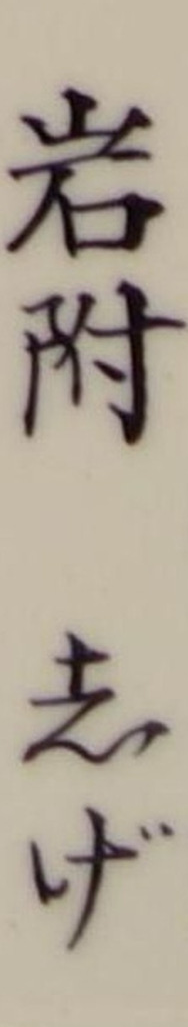岩附しげ
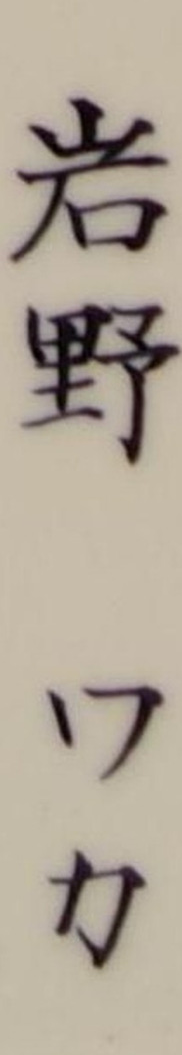岩野ワカ
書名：M~S
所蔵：高野山金剛峯寺
